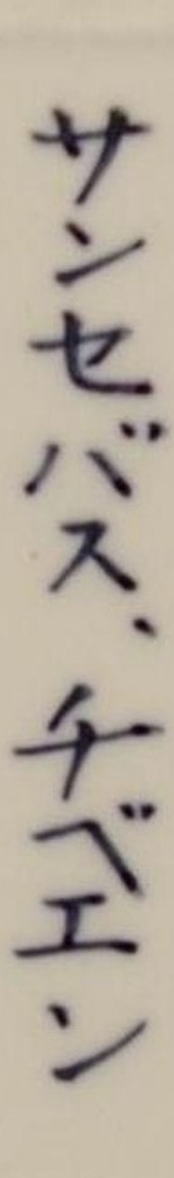サンセバス、チベエン
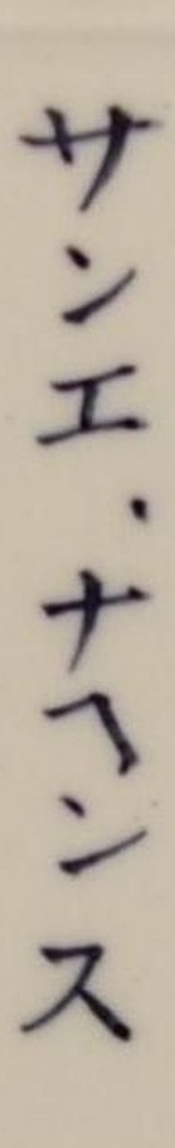サンエ、ナヘンス
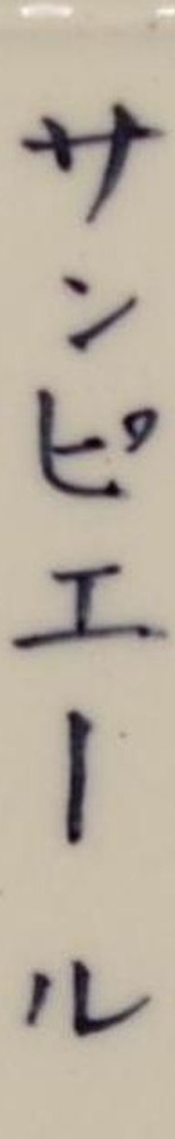サンピエール
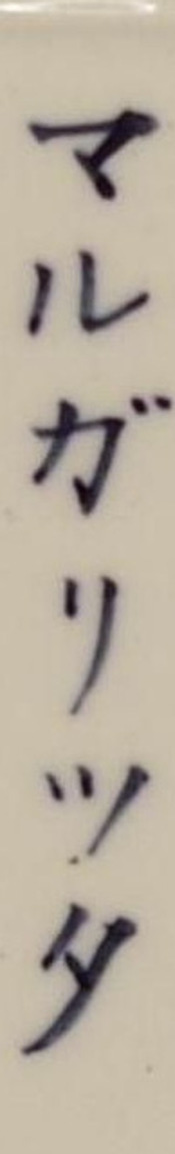マルガリッタ
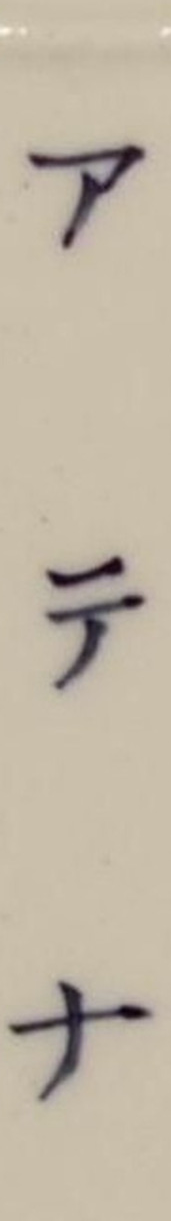アテナ
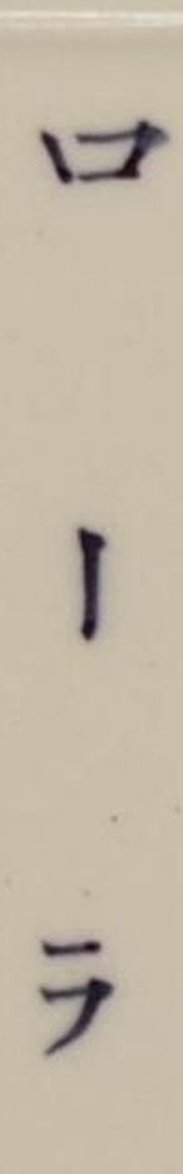ローラ
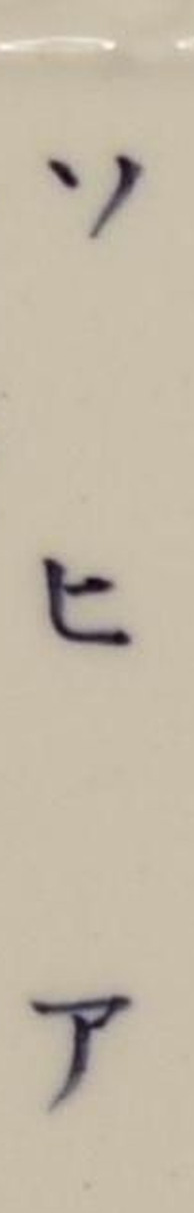ソヒア
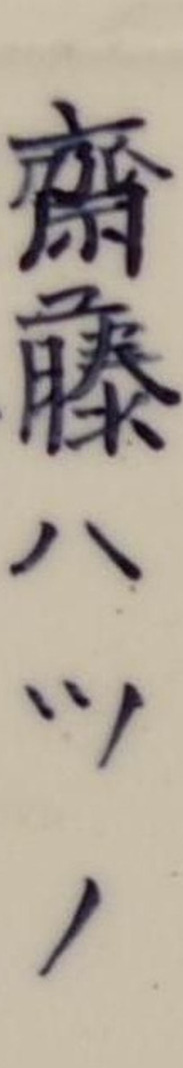斎藤ハツノ
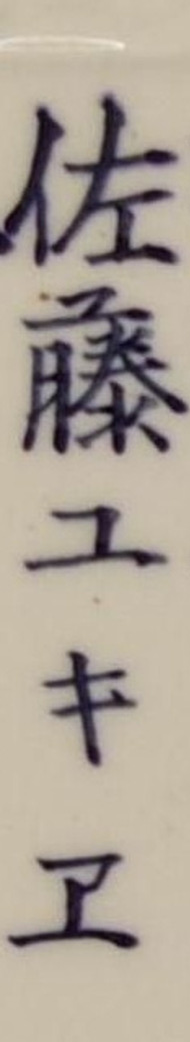佐藤ユキヱ
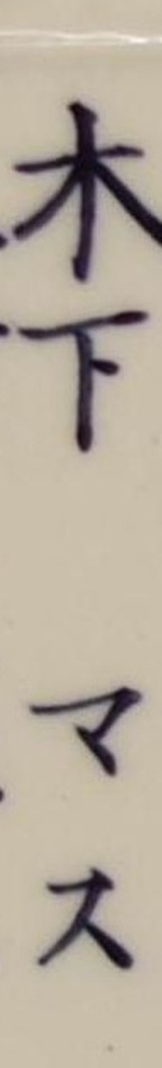木下マス
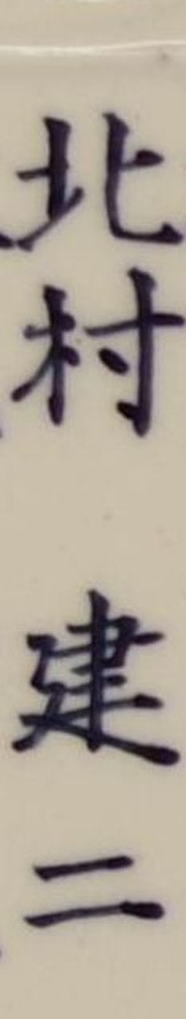北村建二
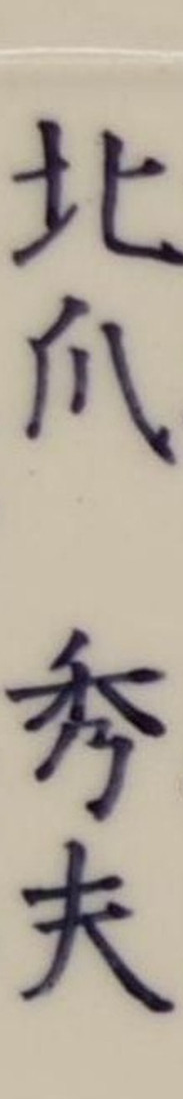北爪秀夫
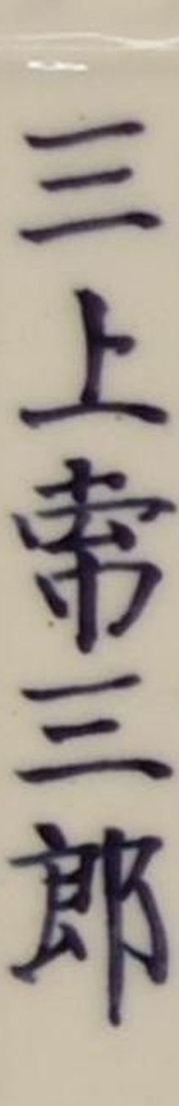三上常三郎

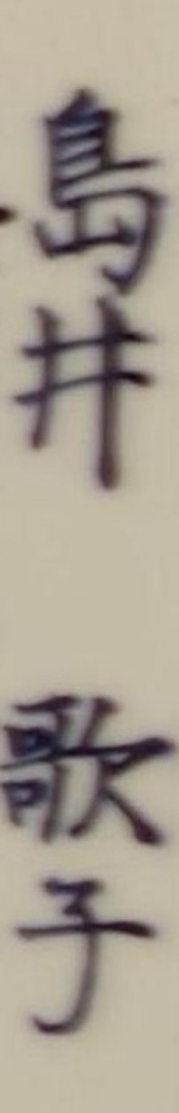島井歌子
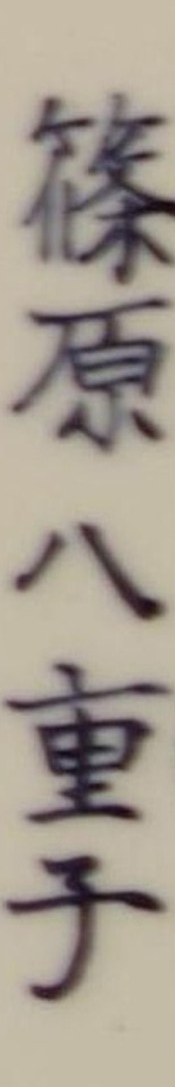篠原八重子
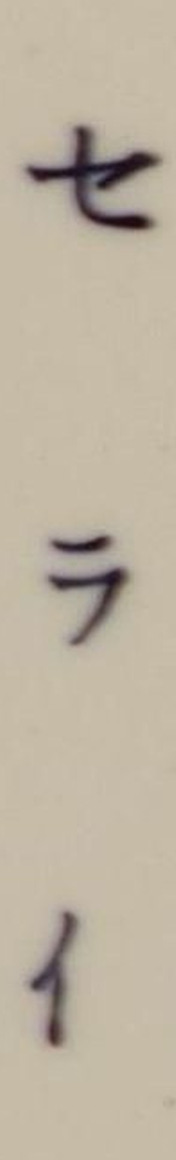セライ
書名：M~S
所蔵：高野山金剛峯寺
